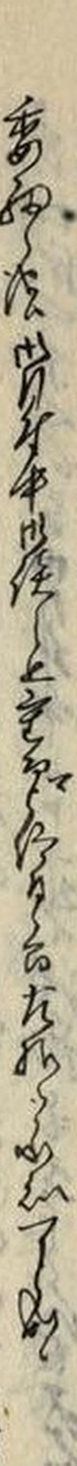委細之儀は御目付中御談之上重而可被仰付候間左様御承知可被成候当番
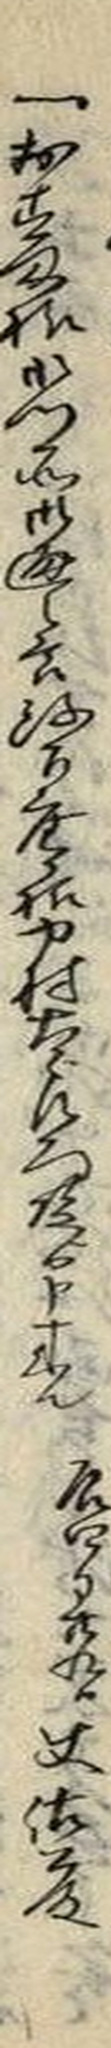一御すま様御門所御通之節致下座候様中村太郎左衛門殿ゟ申来候辰四月廿九日使佐藤
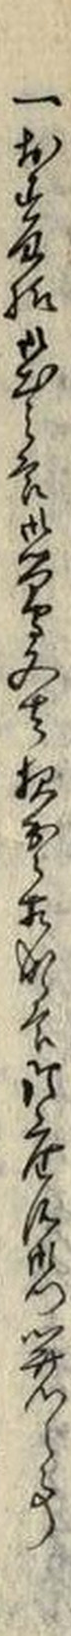一御すま様御出之節御留守又は夜分に相成候節御座所御門開門候事
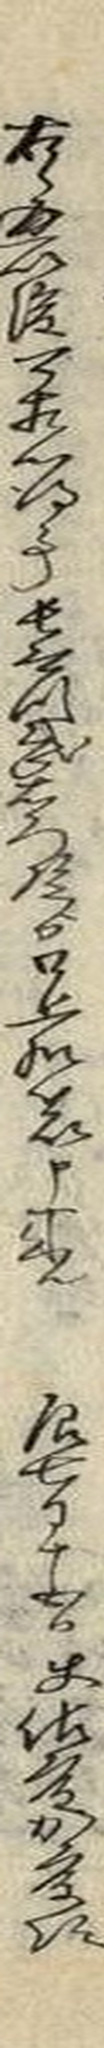右之通以後可相心得事長谷川武右衛門殿ゟ口上扣を以申来候辰七月十五日使佐藤加藤次
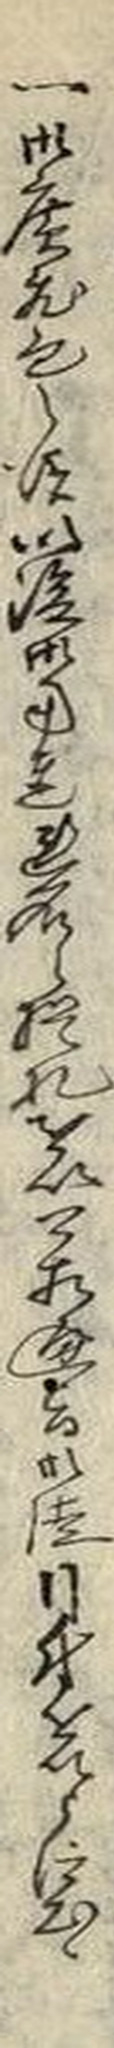一御広敷包之儀は以後御用達連名之提札を以可相通旨御徒目付を以被仰出候
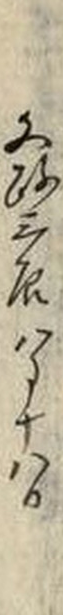文政三辰八月十八日当番
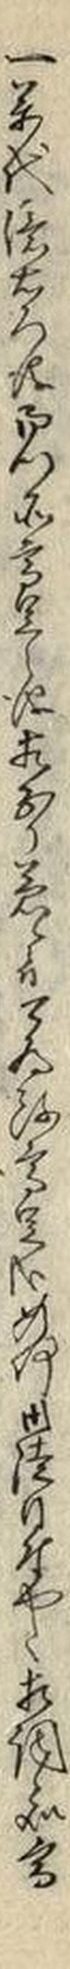一万代億右衛門儀御門所高足之儀相分り兼候に付可為致高足哉如何御徒目付中へ相伺候処高
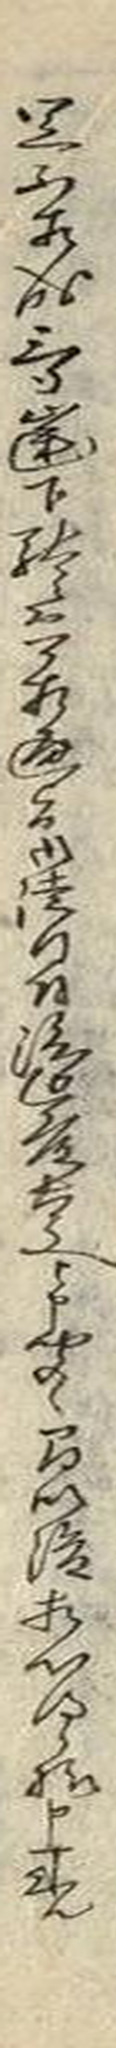足不相成三ツ歯下駄に而可相通旨御徒目付渡辺藤太夫被申聞候間以後相心得候様申来ル
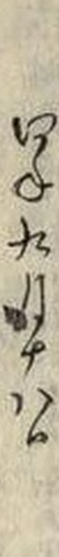同年九月十八日
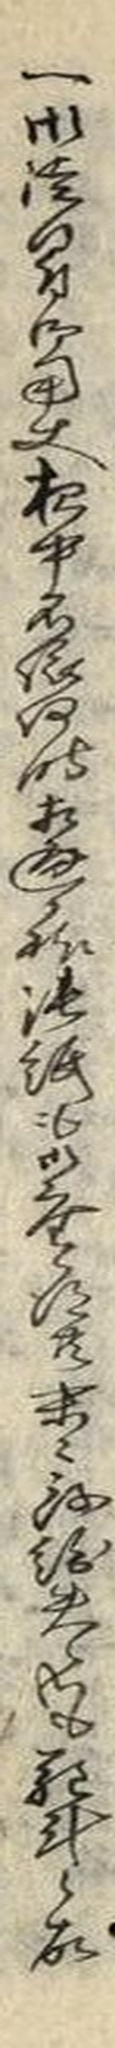一御徒目付御用使夜中不依何時相通候様張紙も御座候得共末々致紛失候哉も難斗候故
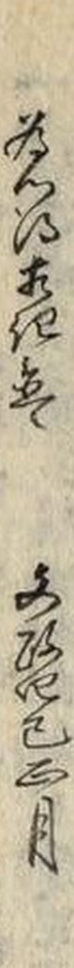為心得相記置候文政四己正月当番
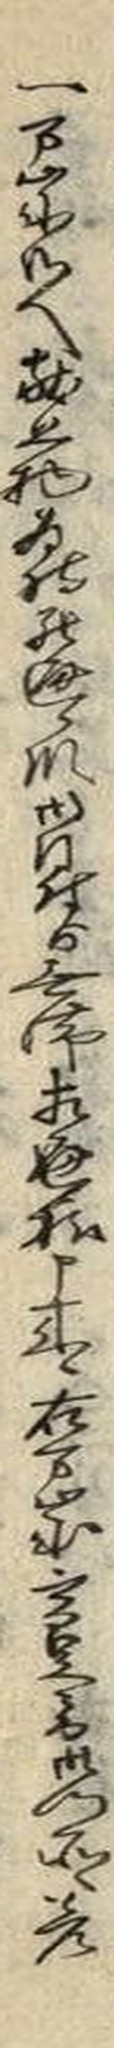一万歳弐人献上物為持罷通候段御目付ゟ無滞相通候様申来候右万歳高足に而御門所へ差
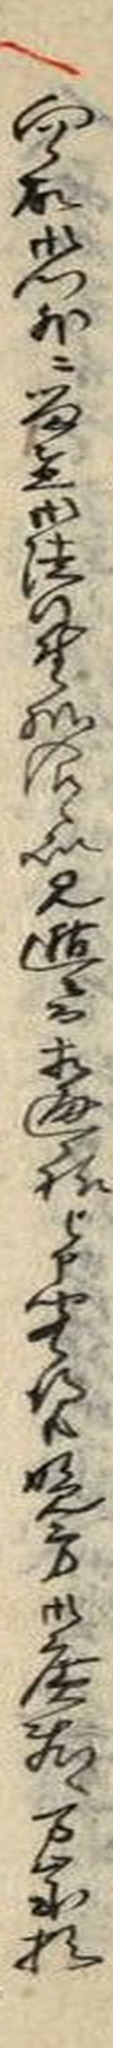向候故御門外に留置御徒目付へ掛合候処見遁に而相通候様被申聞候得共晩方御広敷へ万歳拾

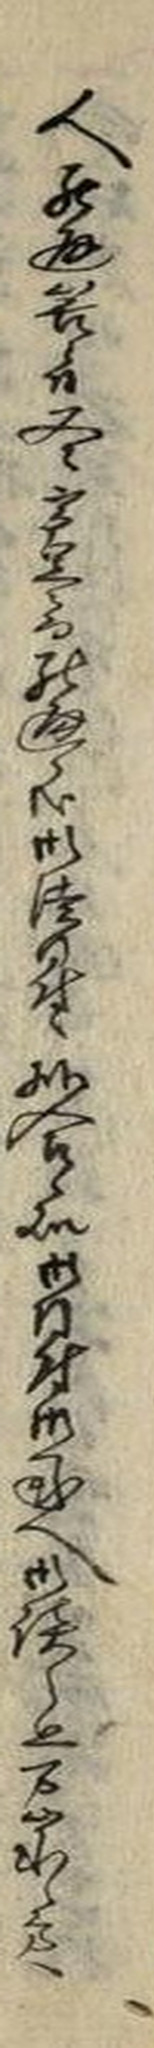人罷通筈に付又々高足に而罷通候哉御徒目付へ掛合候処御目付御用人御談之上万歳之方へ
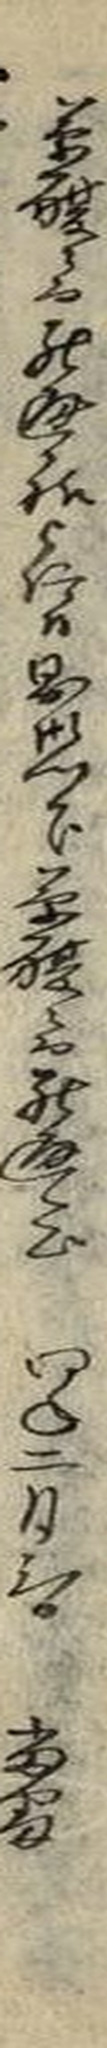草履に而罷通候様被仰付則御門下草履に而罷通候以上同年二月三日当番
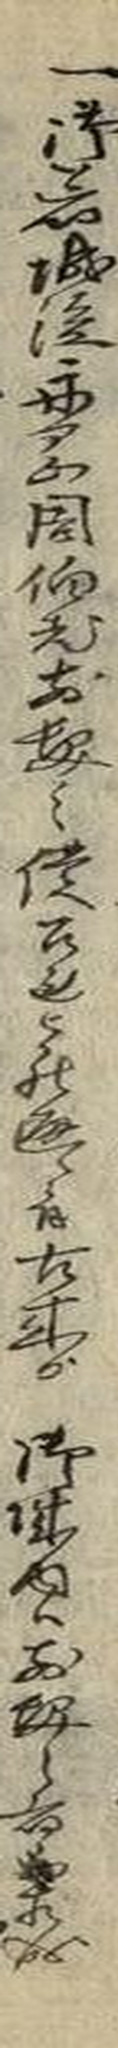一御着城後舟岡周伯老前髪之僕召連被罷通候に付古来ゟ御城内前髪之者相成不申
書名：御門御櫓之部
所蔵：福井県文書館 Fukui Prefectural Archives
